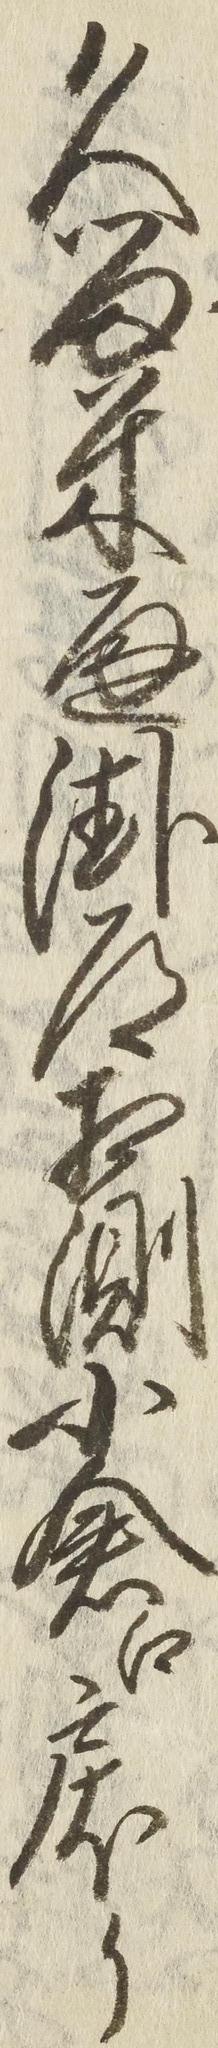久留米通街道相測小倉江戻り
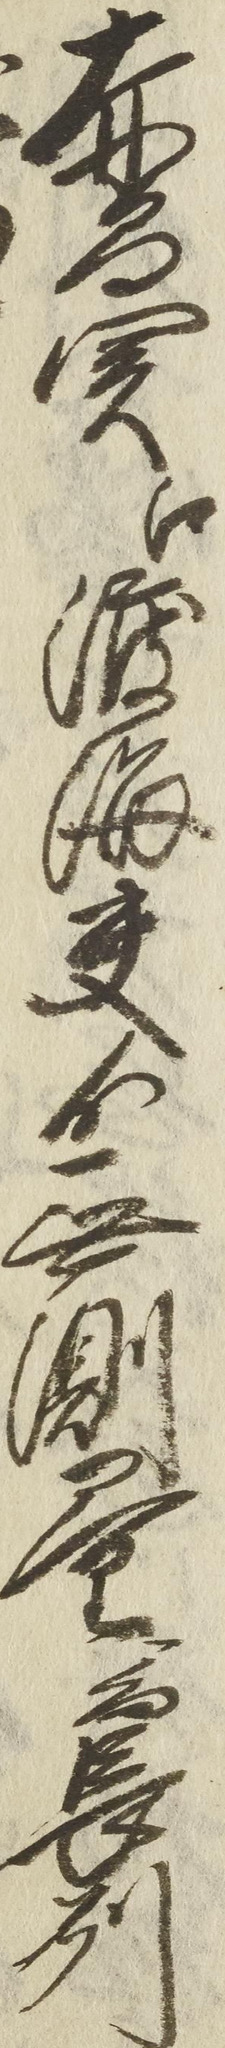赤間関江渡海夫ゟ無測量ニ而長州
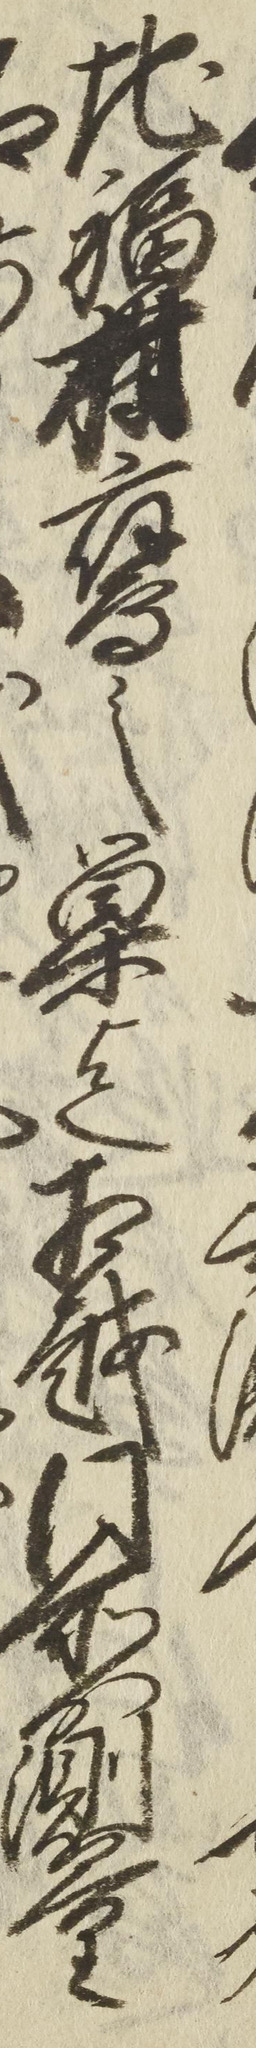地福村鷹之巣迄相越同所ゟ測量
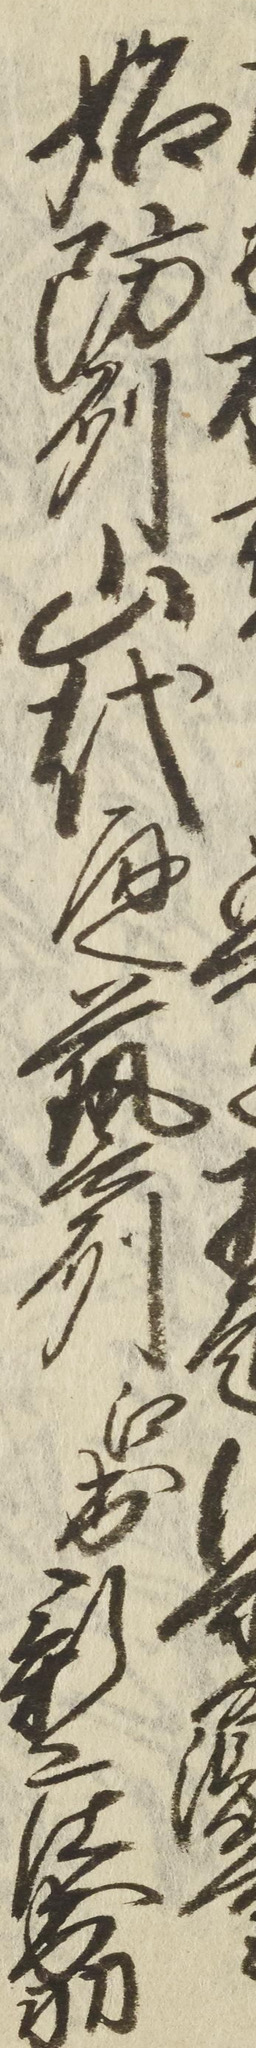始防州山代通芸州江出新庄出
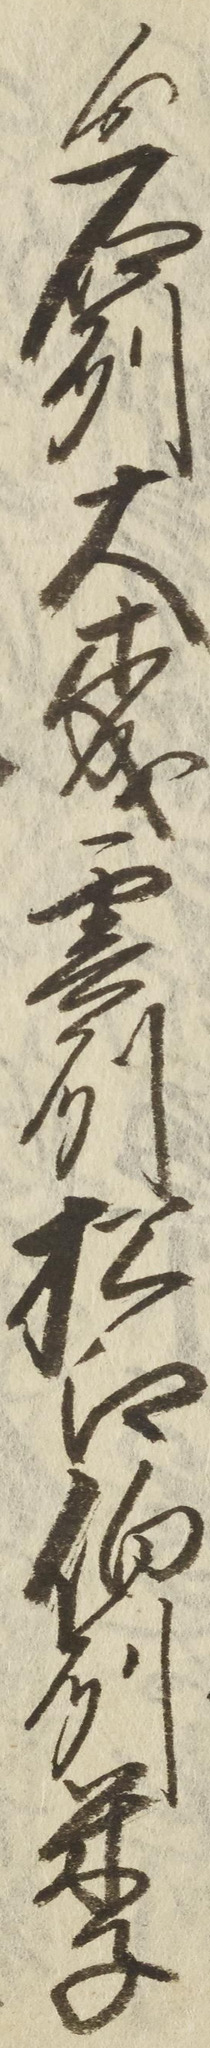ゟ石州大森雲州松江伯州米子
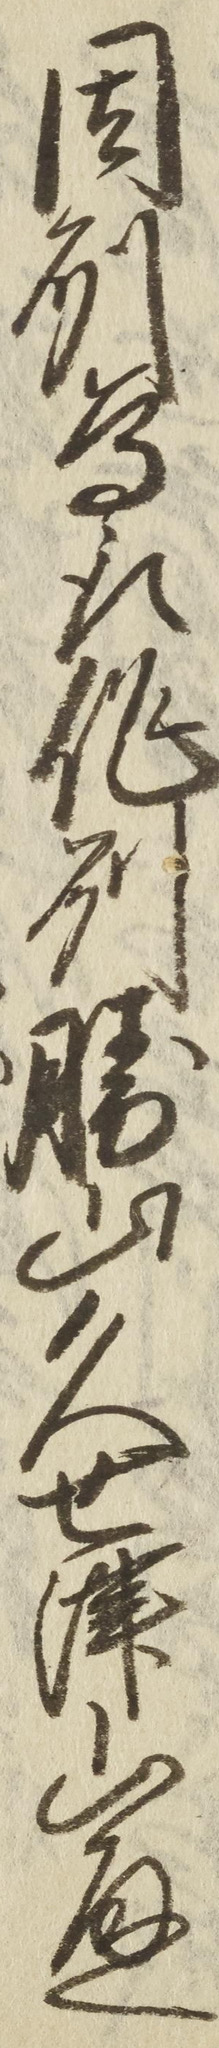因州鳥取作州勝山久世津山通
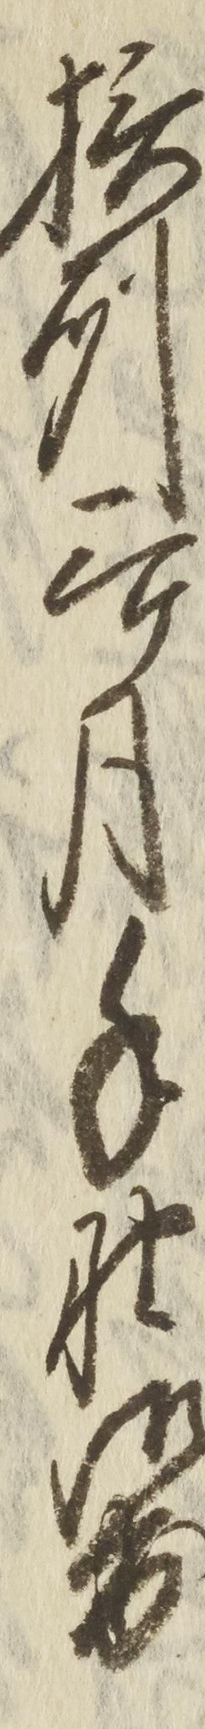摂州三ヶ月手野御出
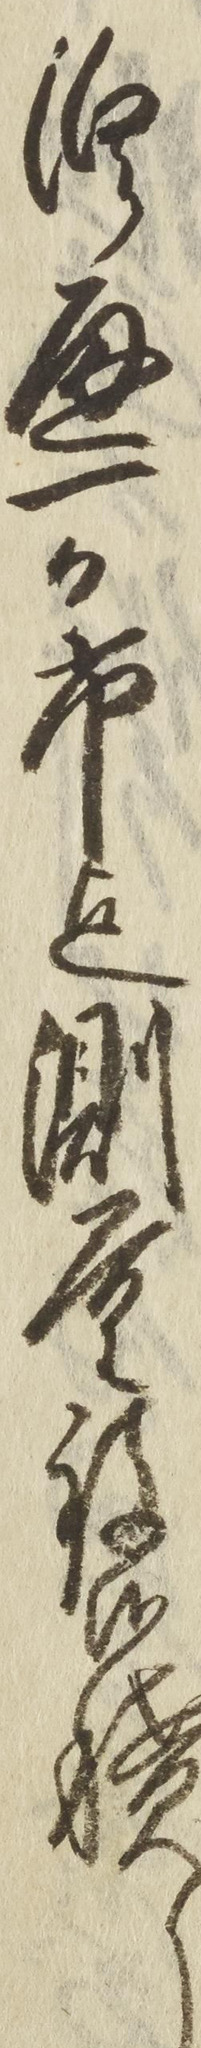泊り通一か市迄測量致候積り

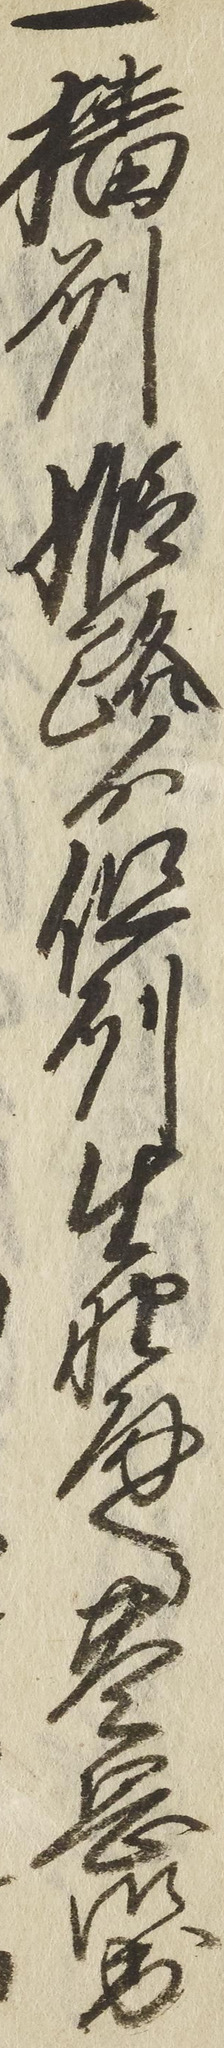一播州姫路ゟ但州生野通豊岡御出
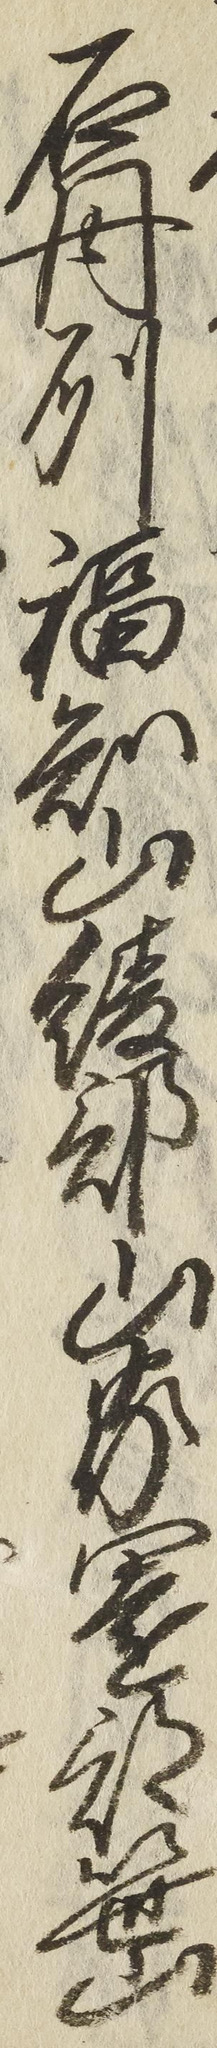石丹州福知山綾部山家園部笹山
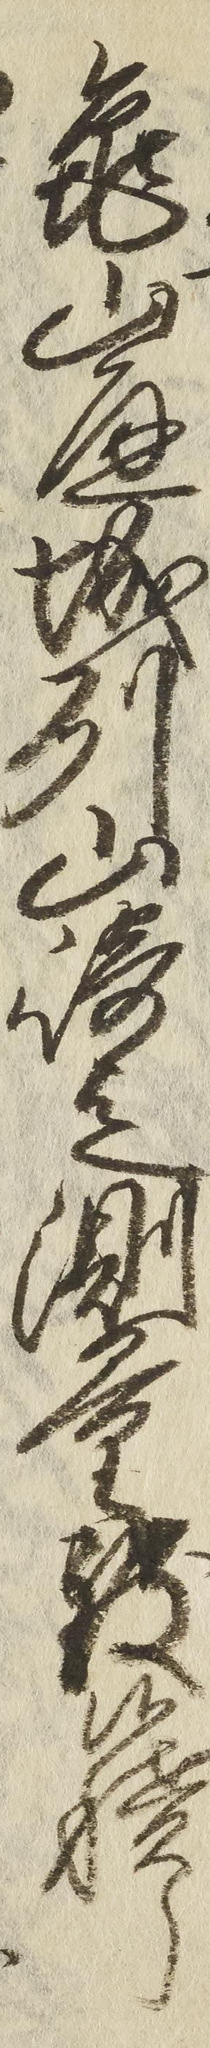亀山通城州山崎迄測量致候積り
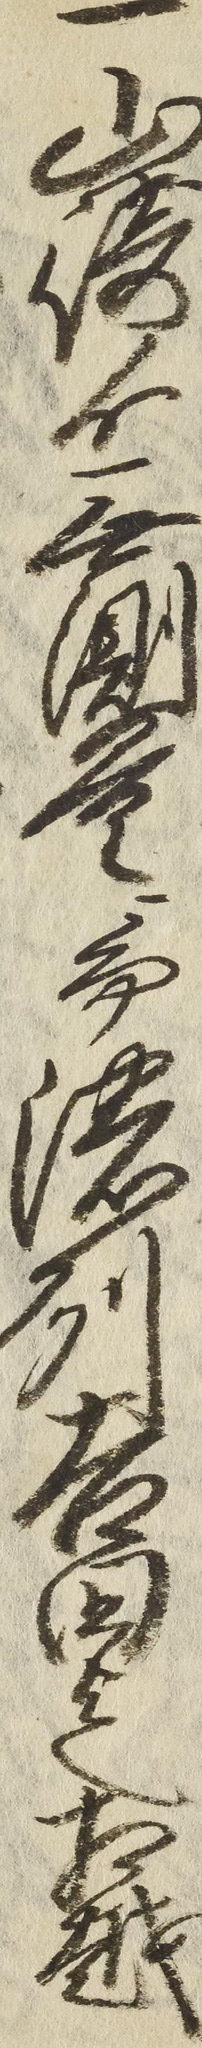一山崎ゟ無測量ニ而濃州吉田迄相越
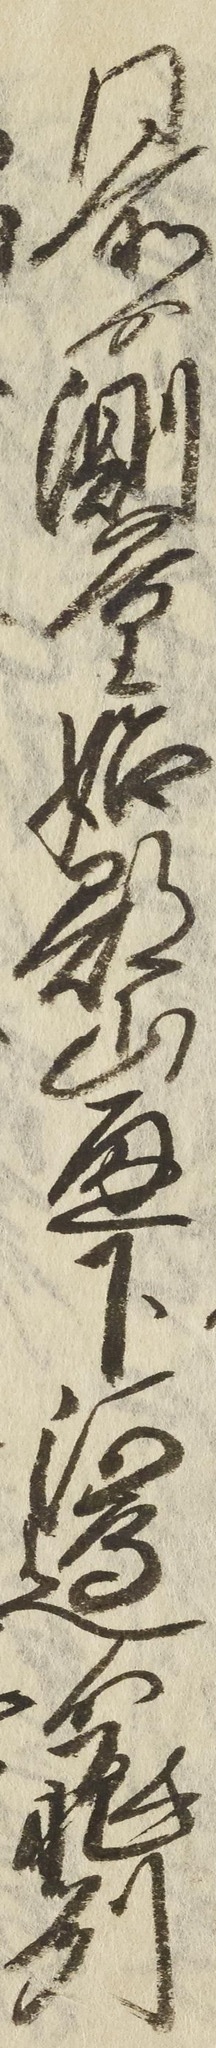同所ゟ測量始郡山通下河辺ゟ飛州
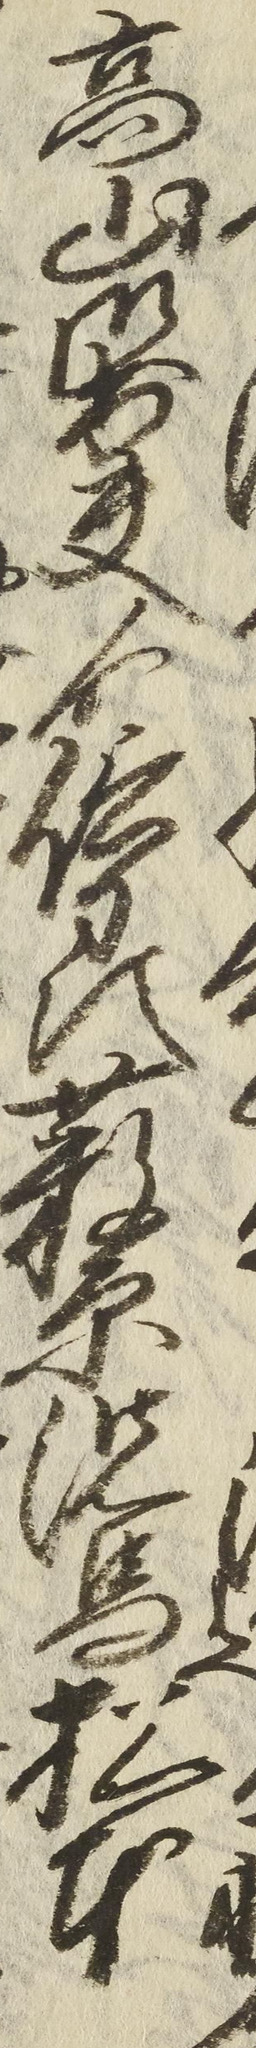高山御出夫ゟ信州藪原洗馬松本
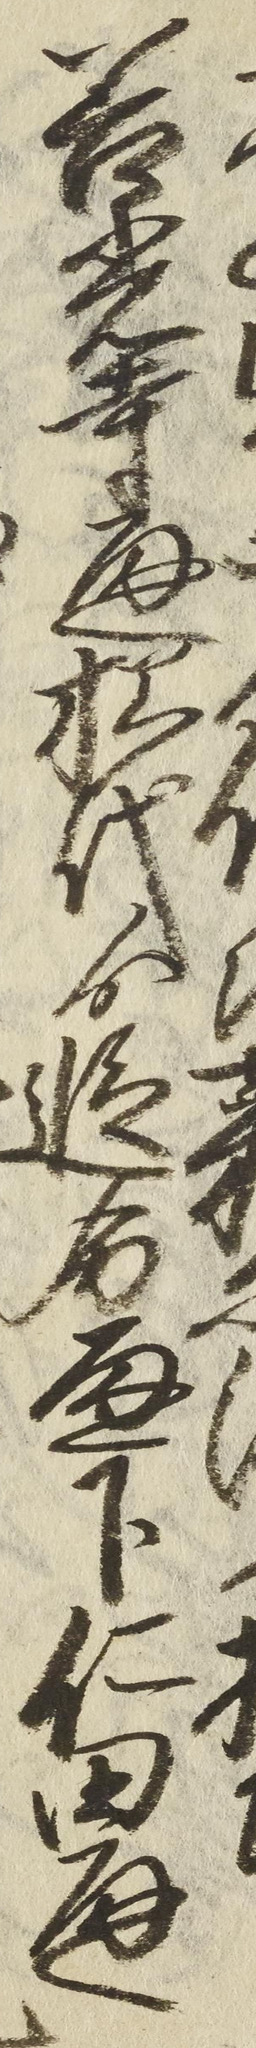善光寺通松代ゟ追分通下仁田通
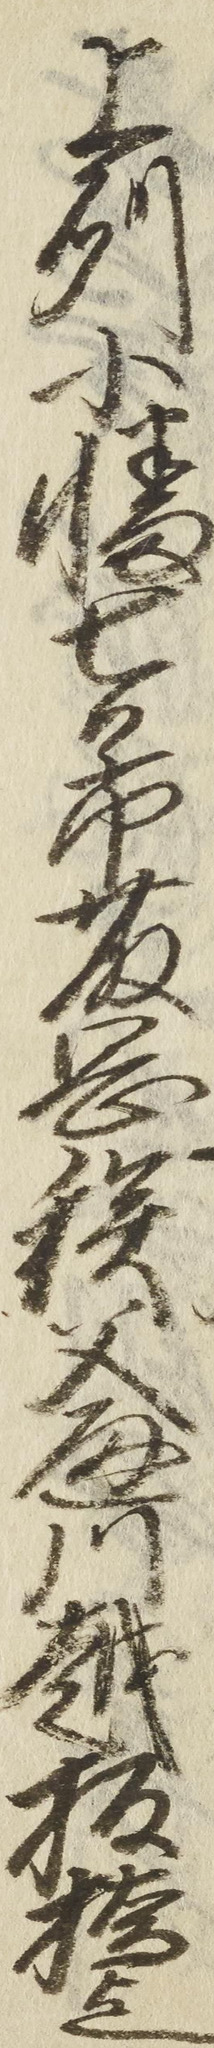上州小幡七日市藤岡秩父通川越板橋迄
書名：天文方御廻御先触写
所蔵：東京大学地震研究所図書室 Earthquake Research Institute Library, The University of Tokyo, JAPAN
